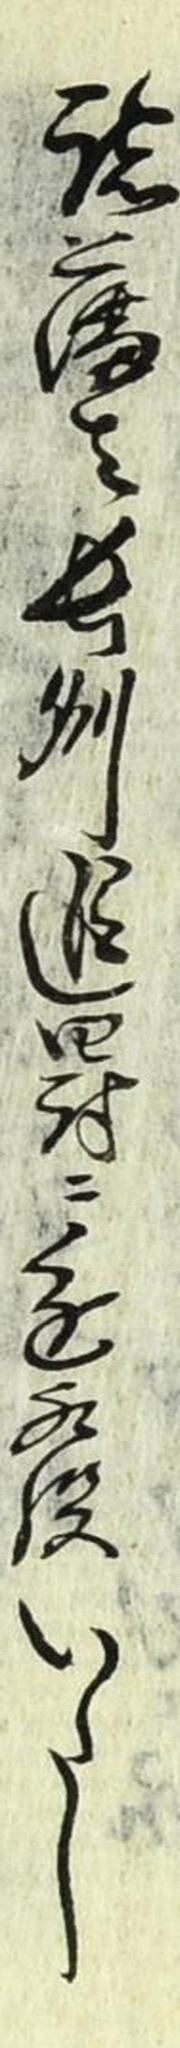諸藩は長州追罰に進発いたし
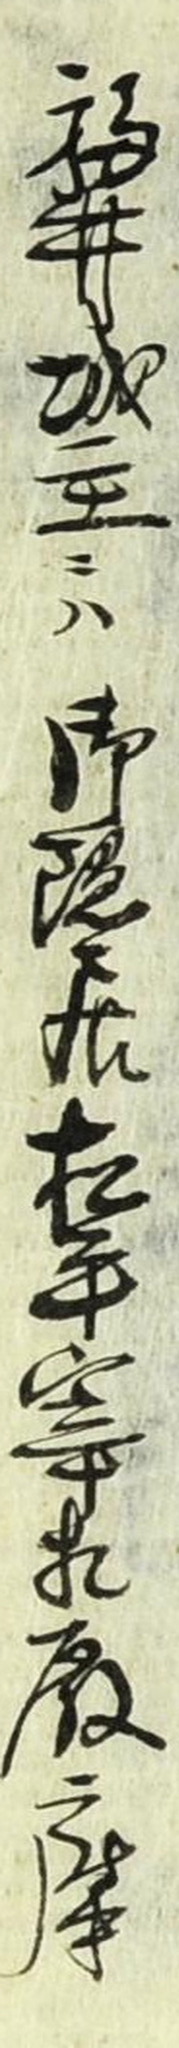福井城主には御隠居松平宰相殿府中
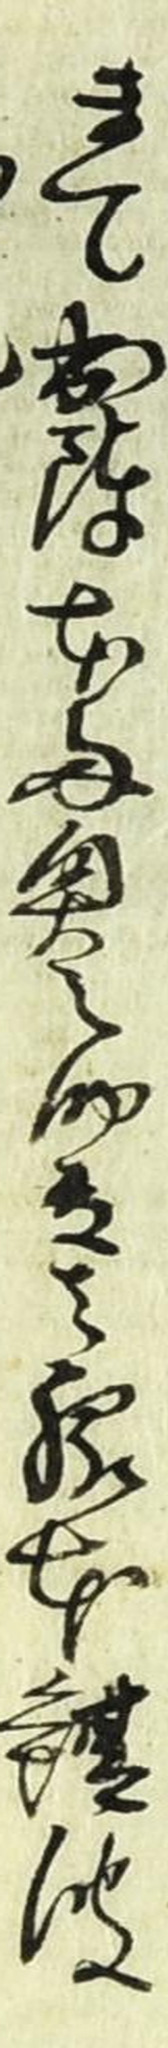まて出陣本多興之助殿は脇本鯖波
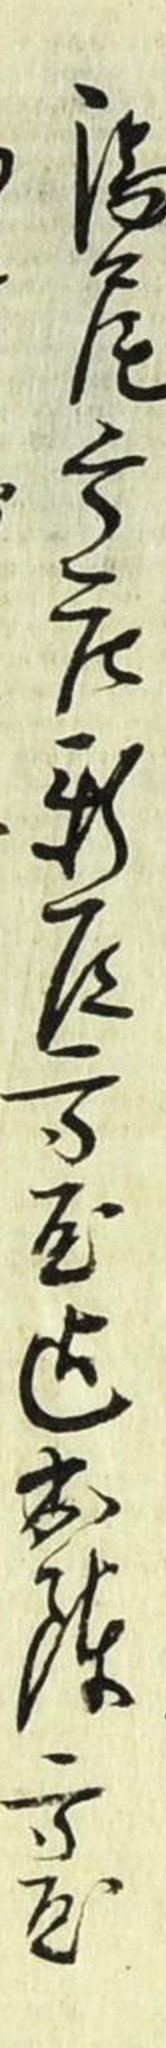湯尾今庄新道二ツ屋迄出陣二ツ屋
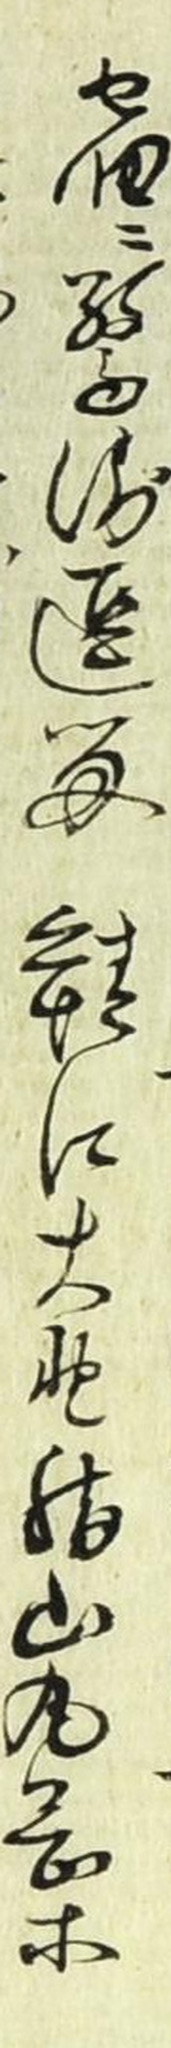宿に警衛逗留鯖江大野勝山丸岡等
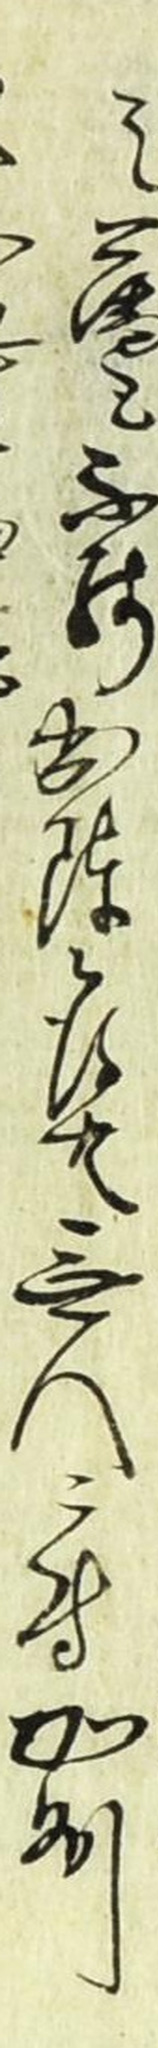之藩も不残出陣候得共無人に付加州
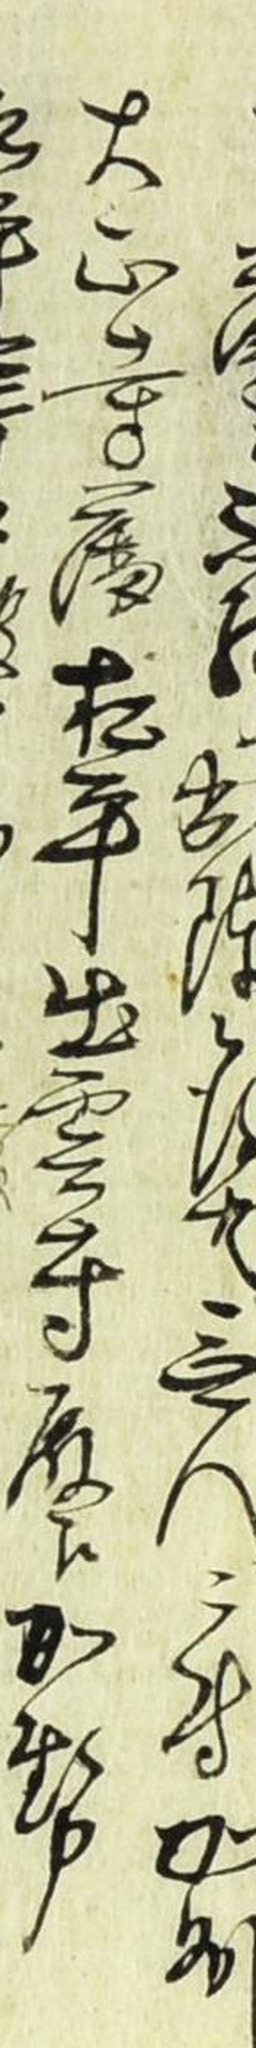大正寺藩松平出雲守殿え加勢
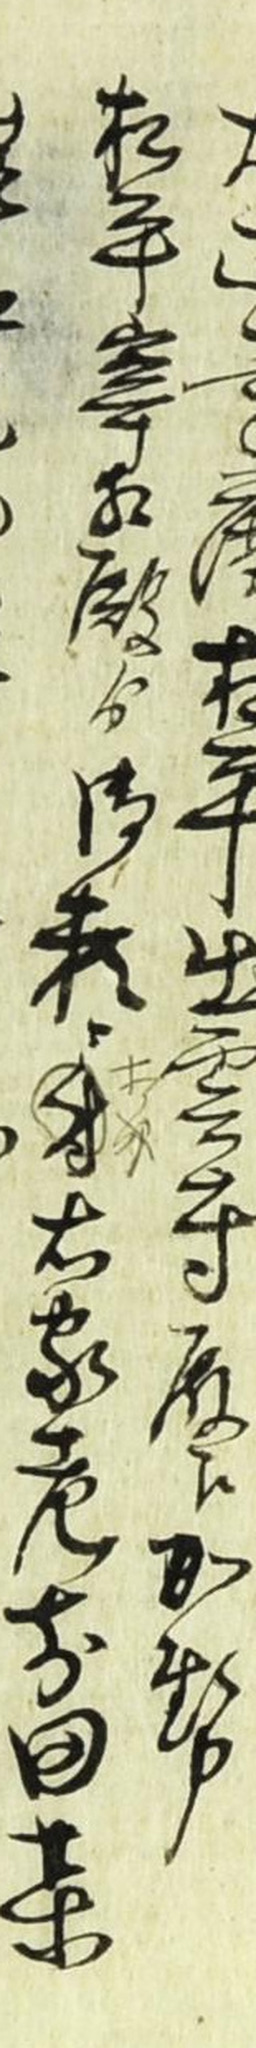松平宰相殿ゟ御頼候と付右家老前田某
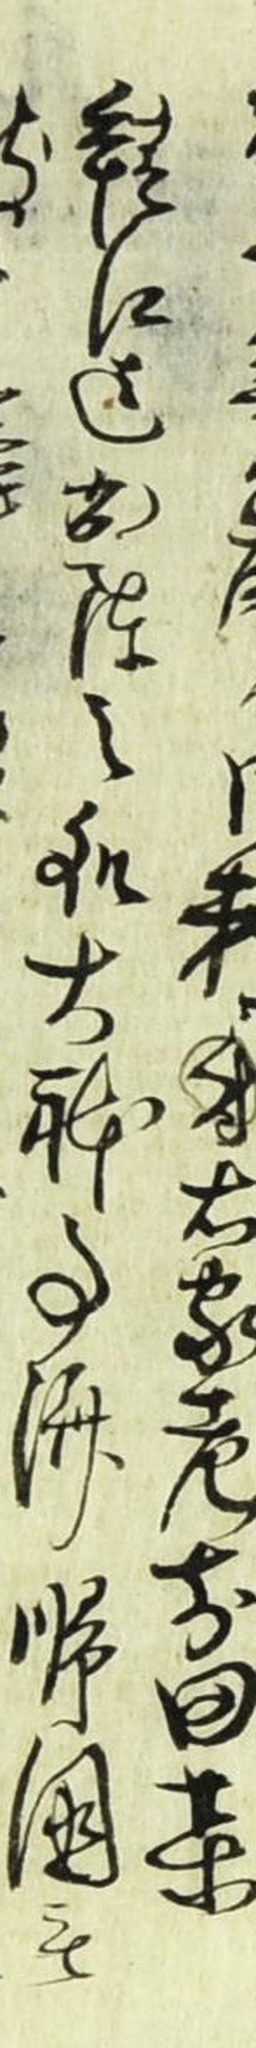鯖江迄出陣之処大体事済帰国被
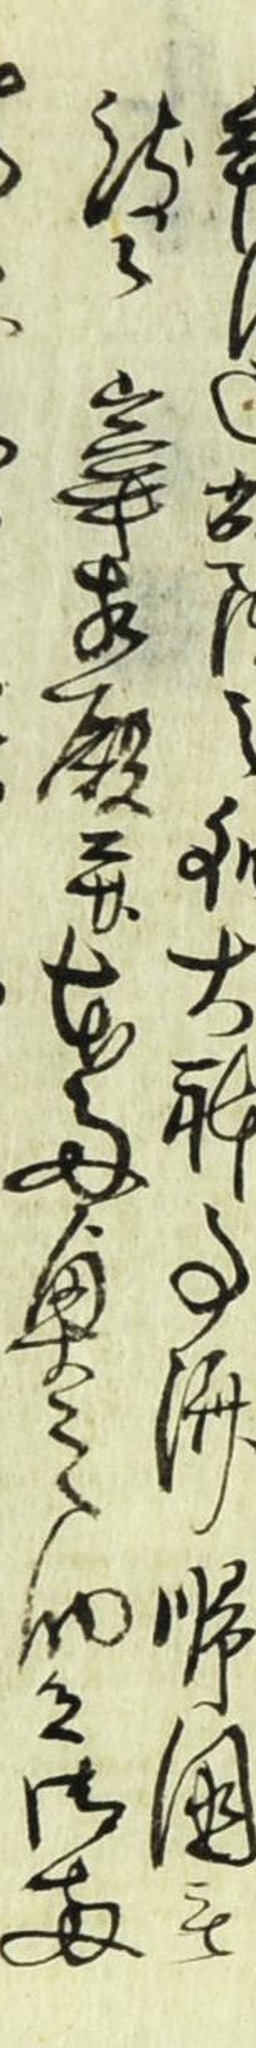致候宰相殿幷本多興之助殿御両
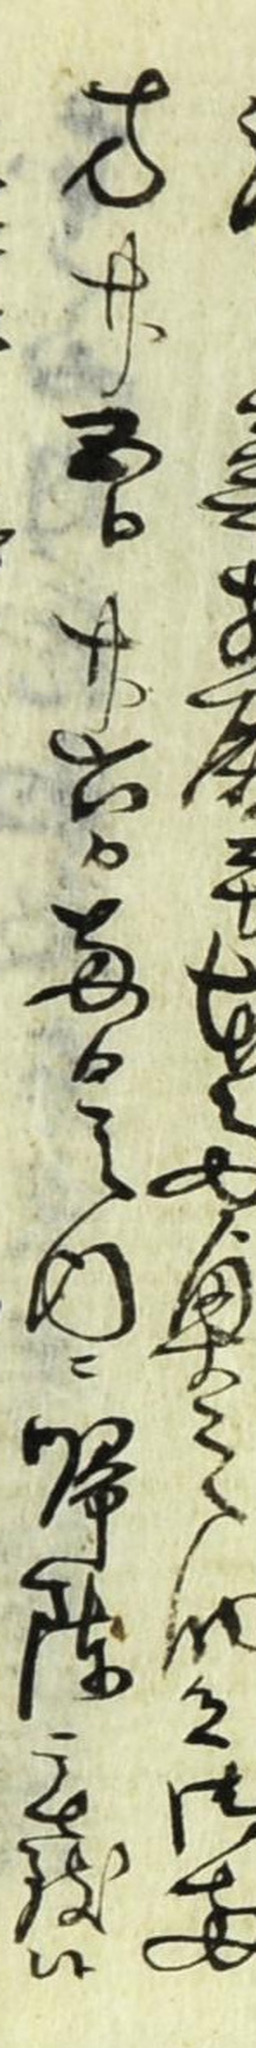方廿五日廿六日両日之内に帰陣被致候
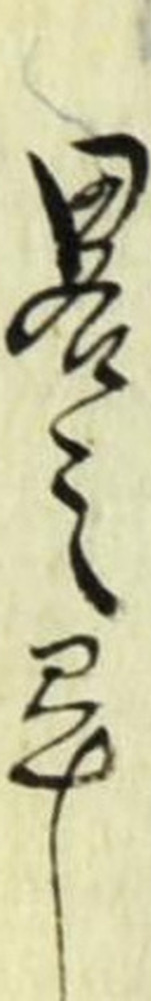略之畢
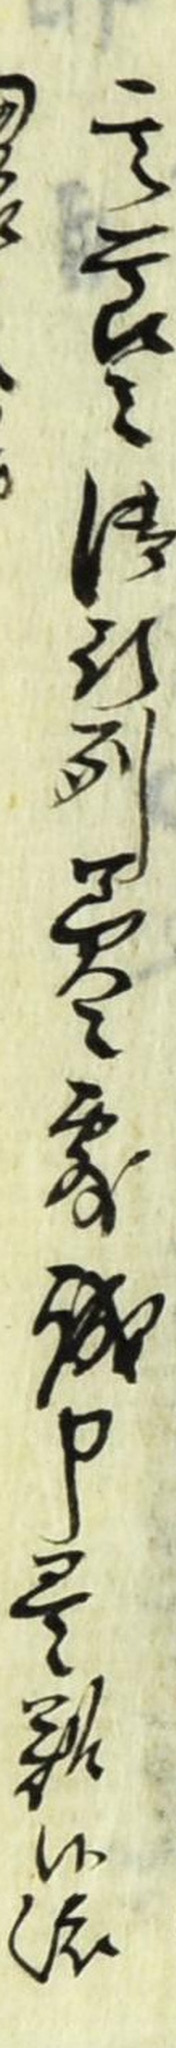其節之御行列美々敷誠申尽難候依
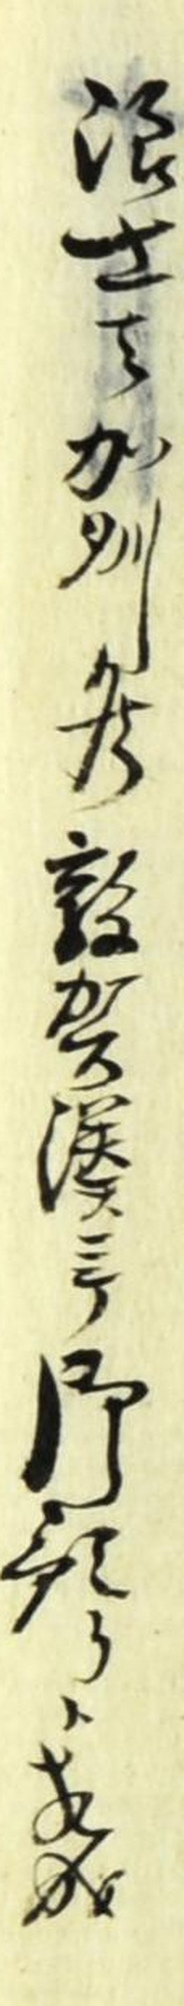浪士は加州侯敦賀湊にて御預りと相成

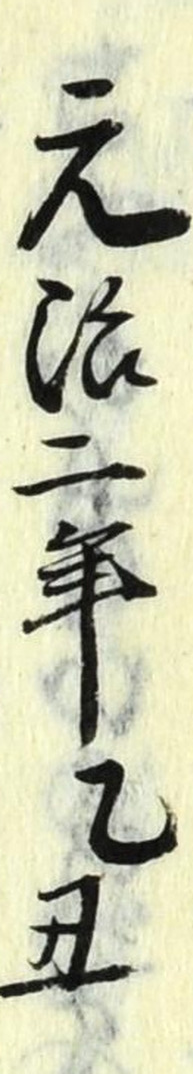元治二年乙丑
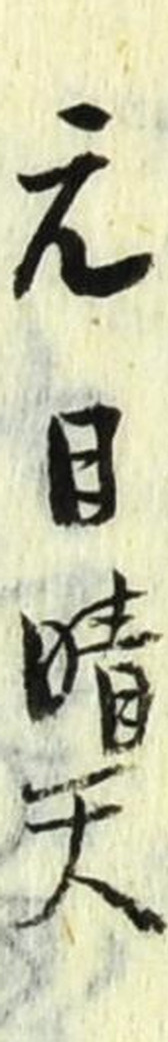元日晴天
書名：（日記）
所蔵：福井県文書館 Fukui Prefectural Archives
